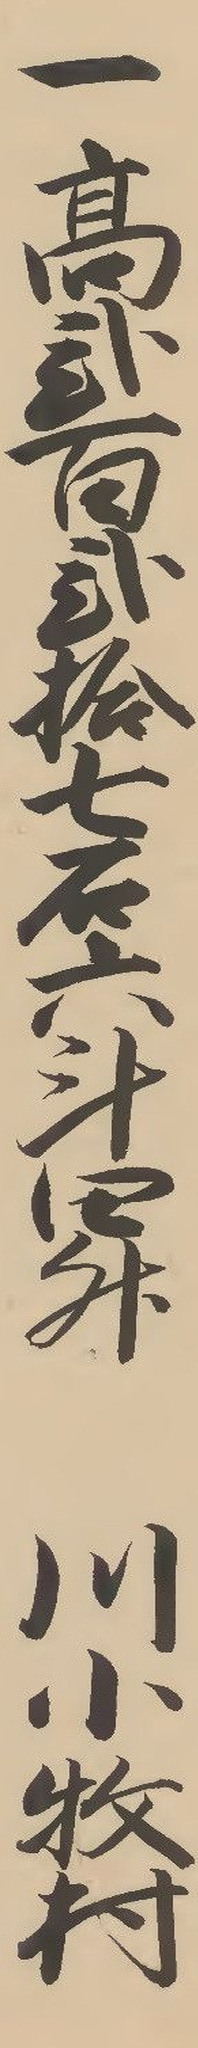一高弐百弐拾七石六斗四升川小牧村
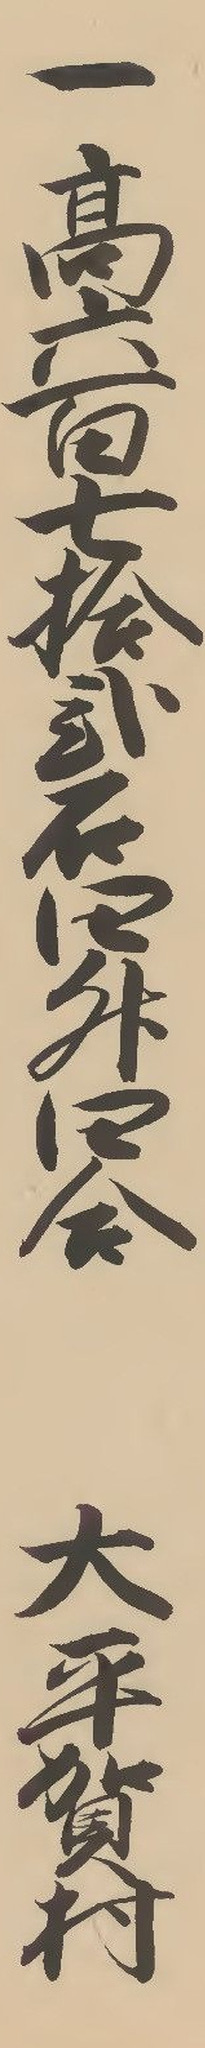一高六百七拾弐石四升四合大平賀村
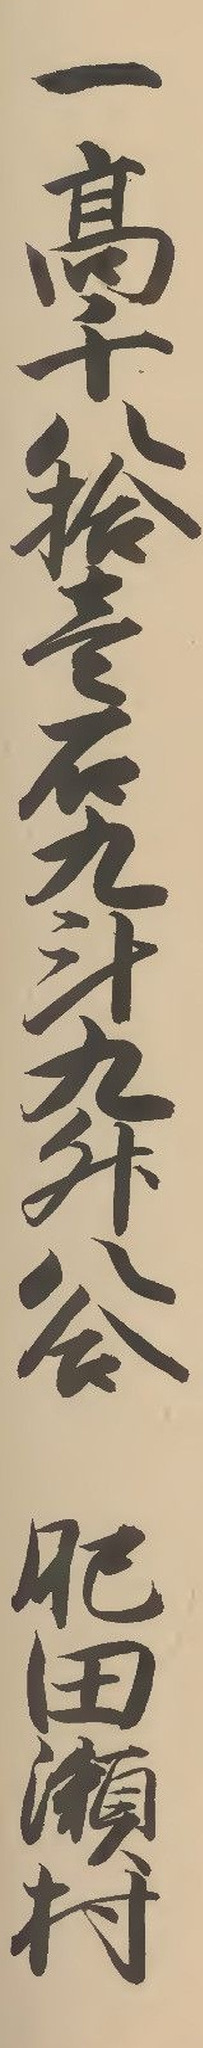一高千八拾壱石九斗九升八合肥田瀬村
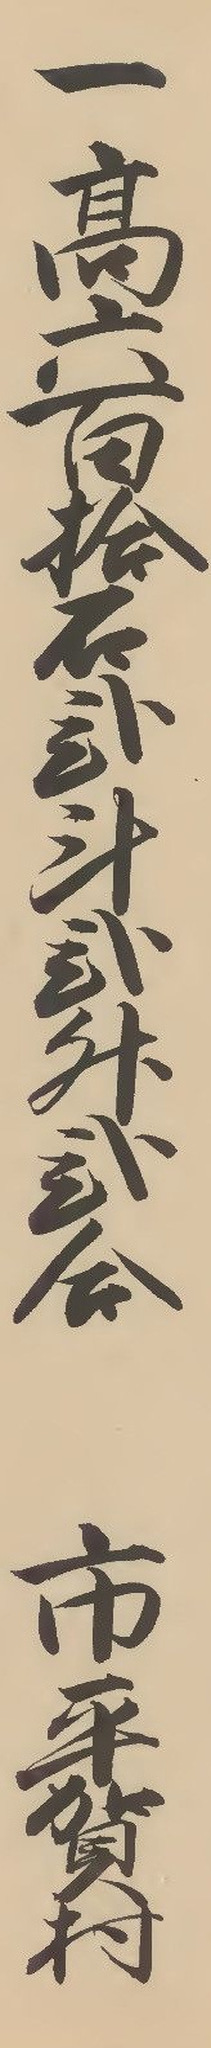一高六百拾石弐斗弐升弐合市平賀村
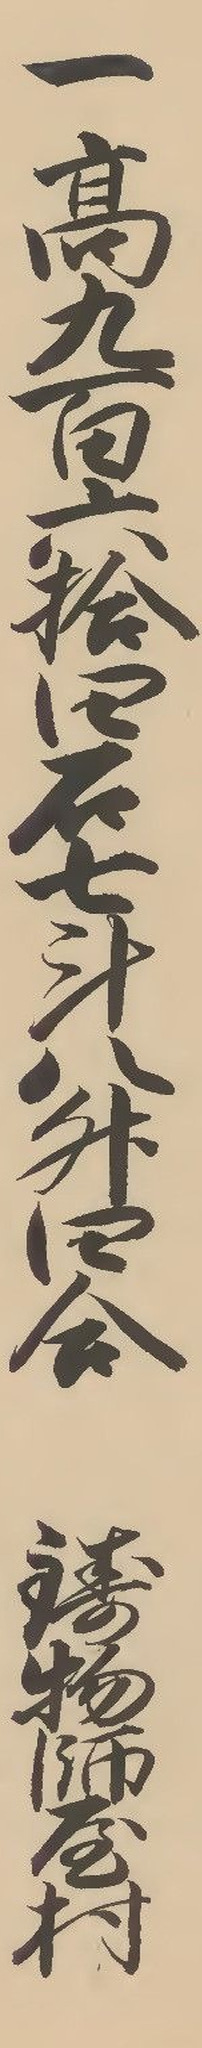一高九百六拾四石七斗八升四合鋳物師屋村

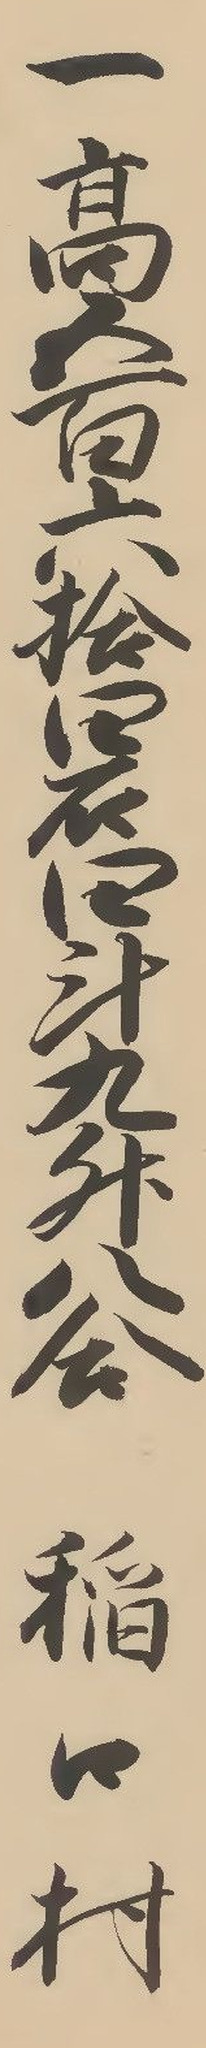一高五百六拾四石四斗九升八合稲口村
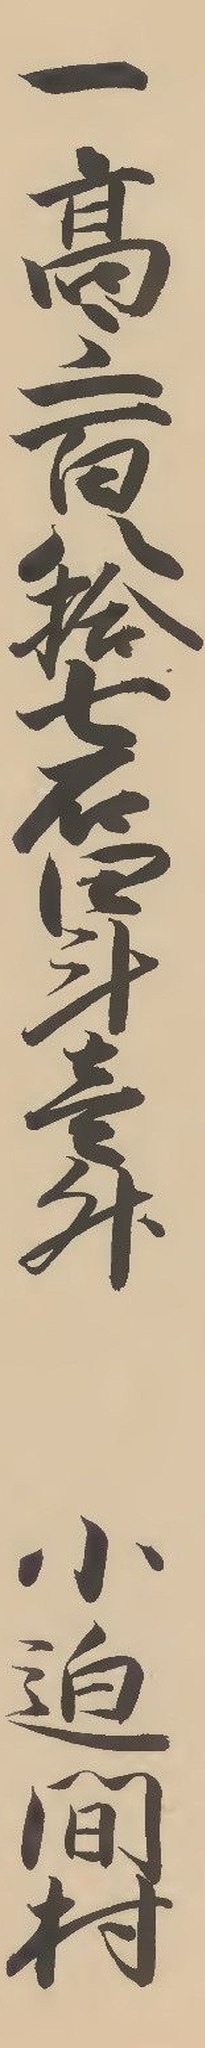一高三百八拾七石四斗壱升小迫間村
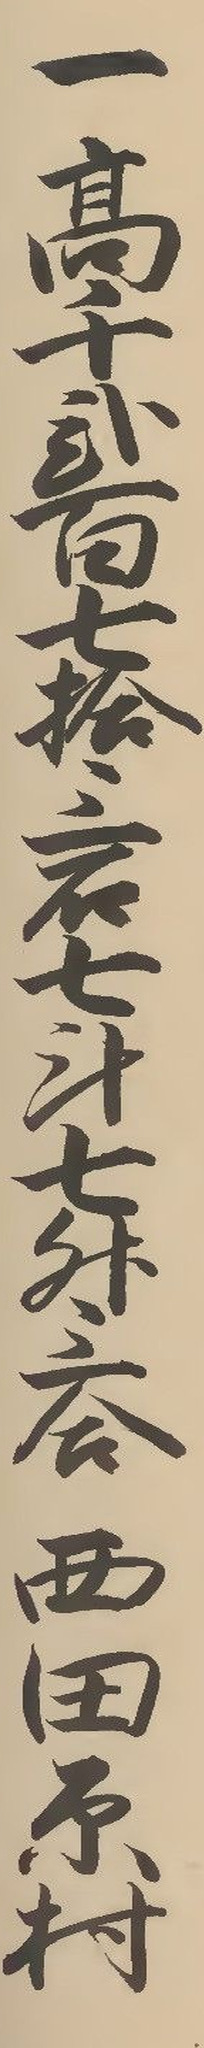一高千弐百七拾三石七斗七升三合西田原村
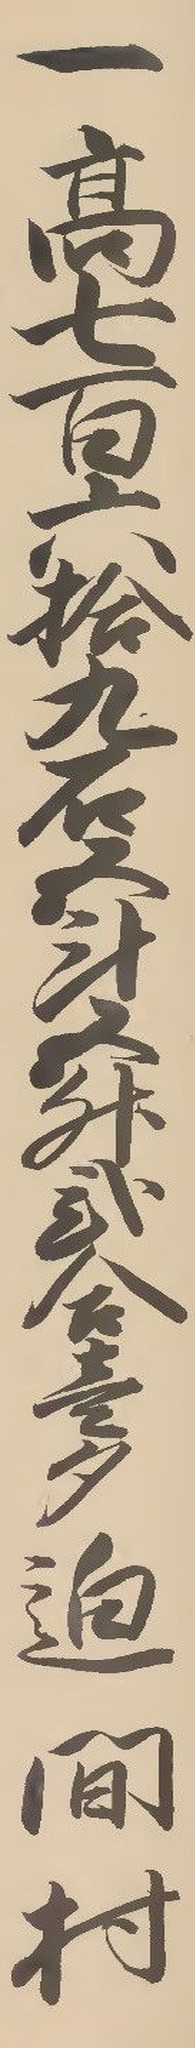一高七百六拾九石五斗五升弐合壱勺迫間村
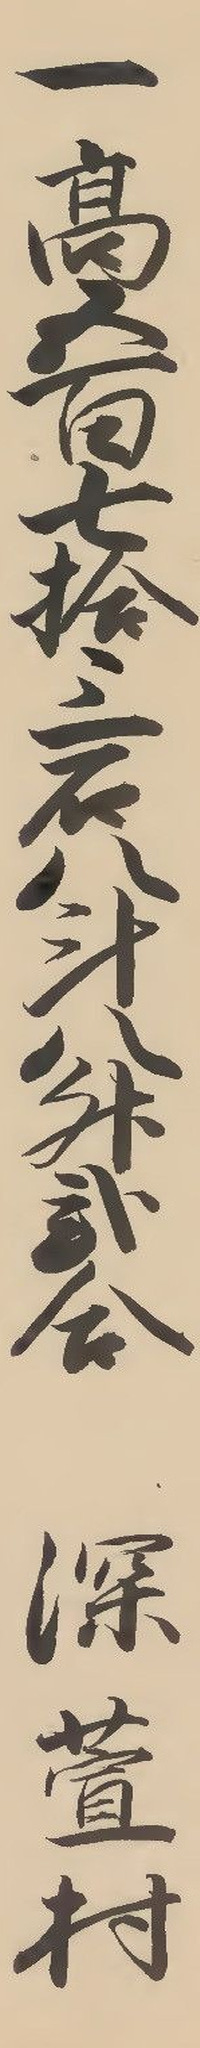一高五百七拾三石八斗八升弐合深萱村
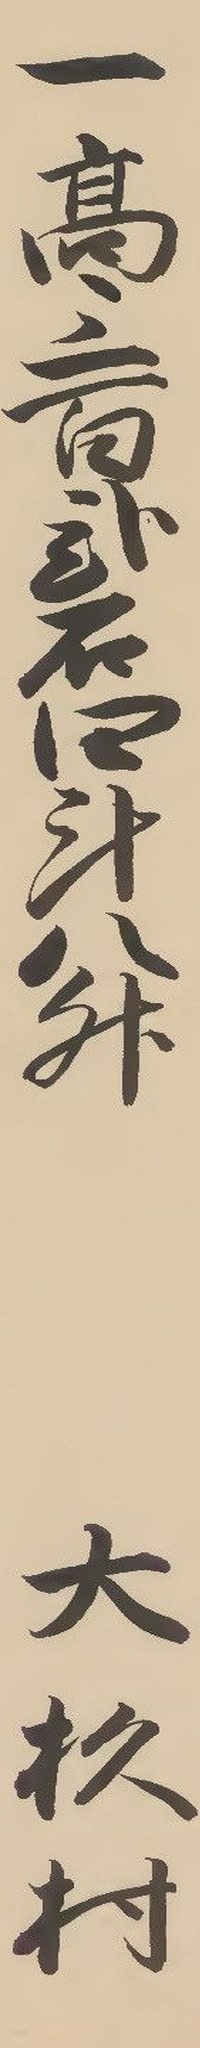一高三百弐石四斗八升大杉村
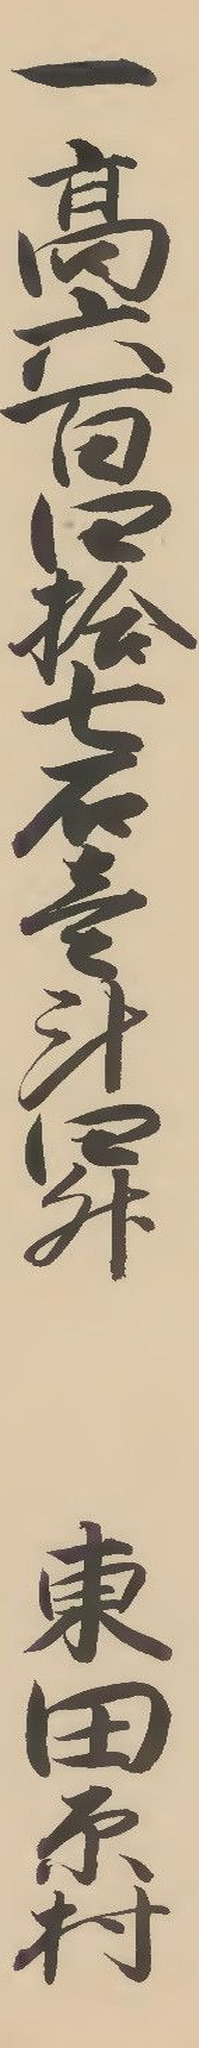一高六百四拾七石壱斗四升東田原村

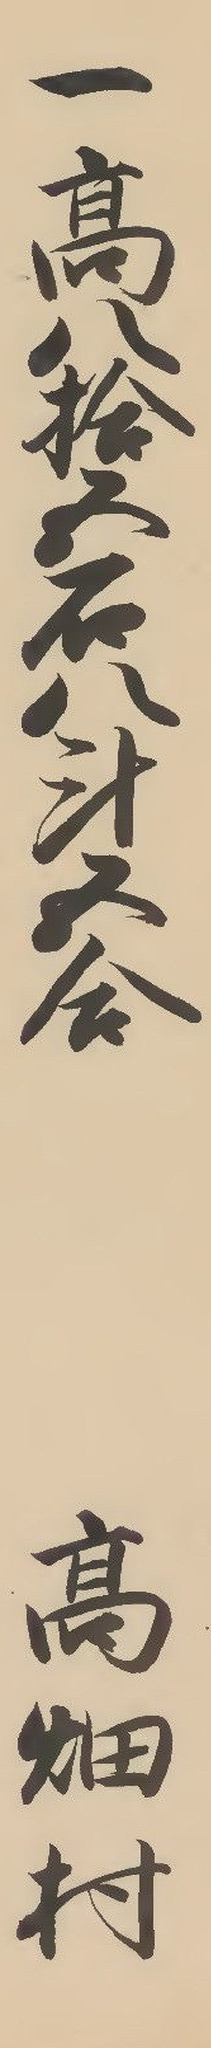一高八拾五石八斗五合高畑村
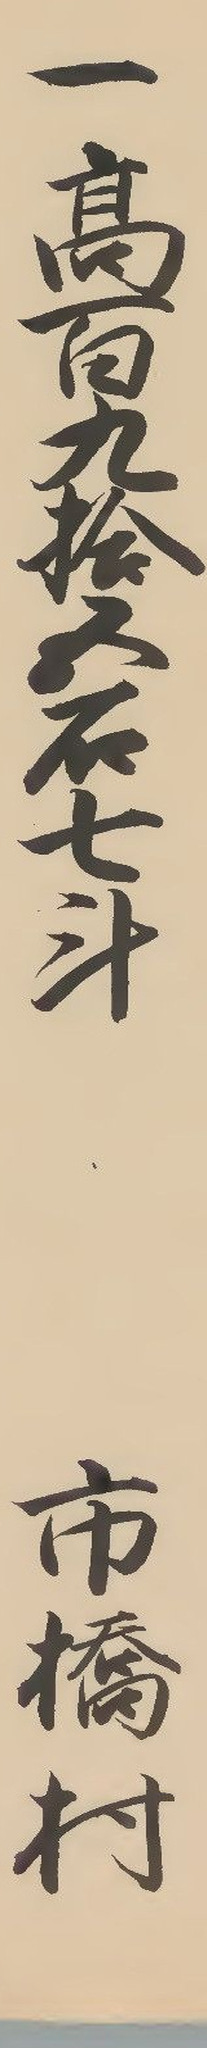一高百九拾五石七斗市橋村
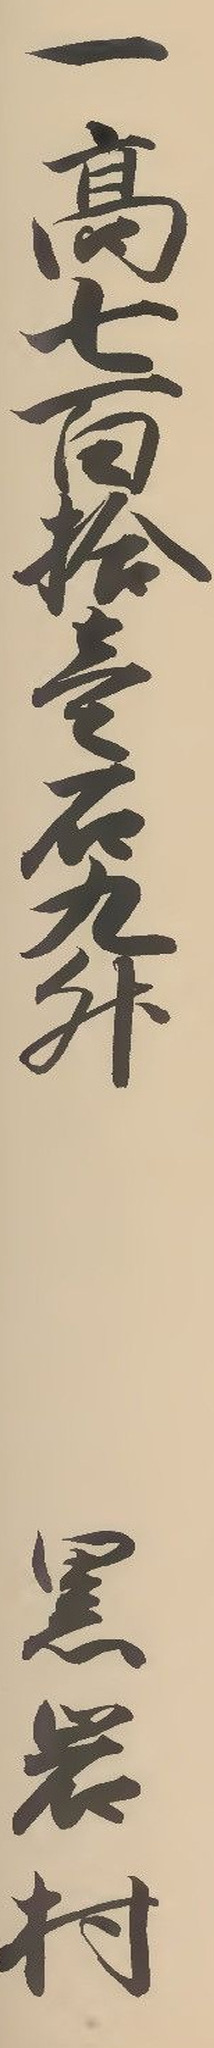一高七百拾壱石九升黒岩村
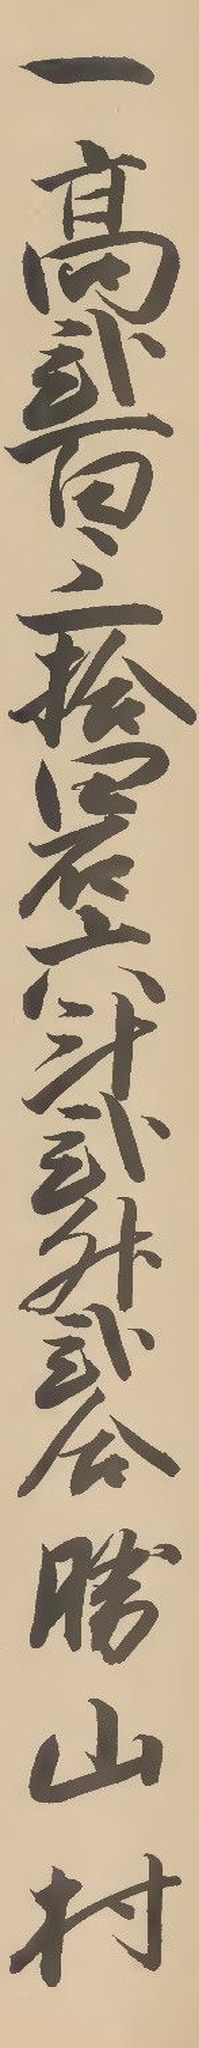一高弐百三拾四石六斗弐升弐合勝山村
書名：美濃国郷帳
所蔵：国立公文書館 National Archives of Japan
